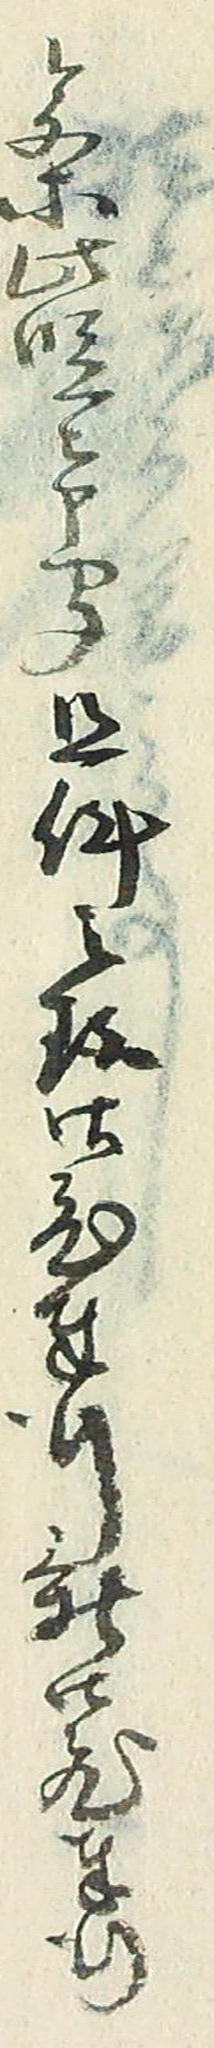候条此段被申聞且件之趣御蔵奉行新御蔵奉行
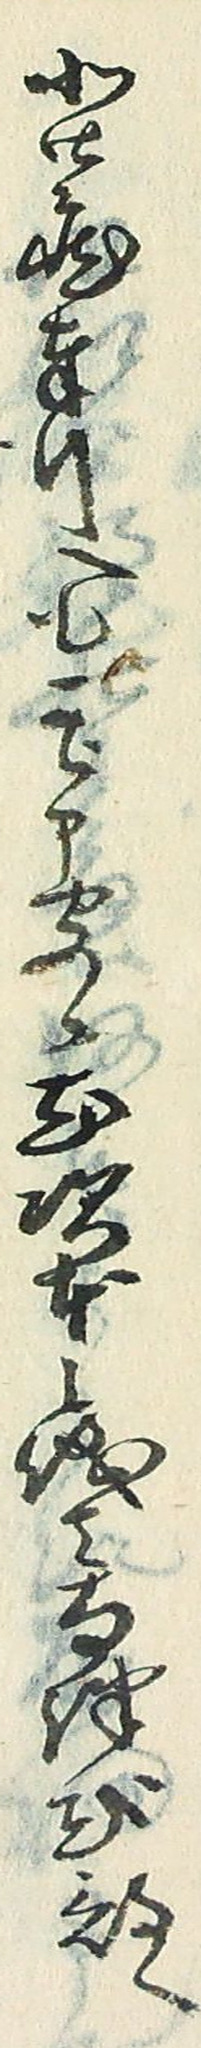北御蔵奉行へも可被申聞候尤須本之儀者寺澤式部へ
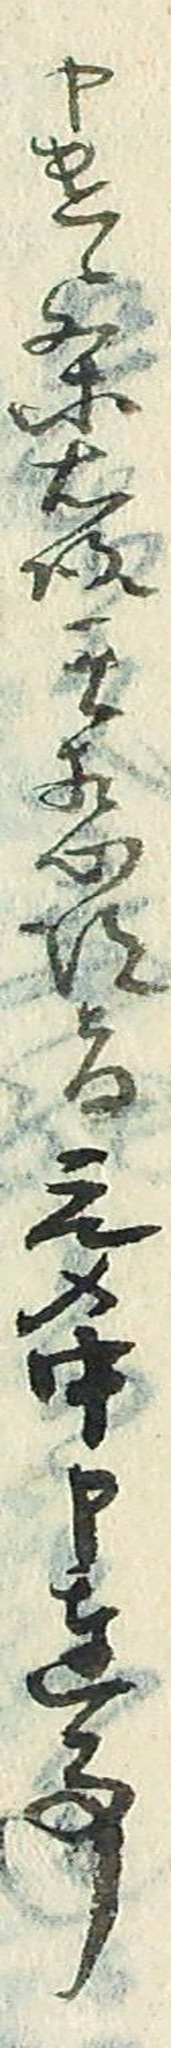申遣候条右様可被相心得旨元〆中申達事
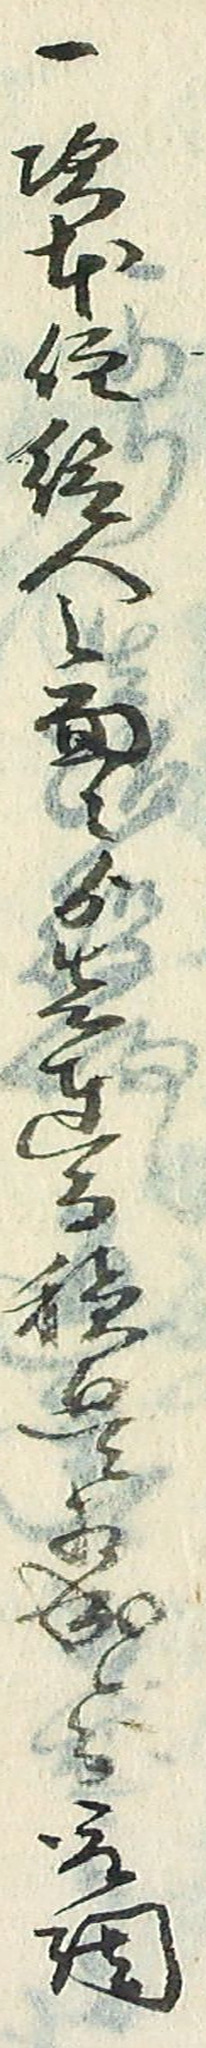一須本住給人之面々ゟ先達而積廻ニ相成候分取調
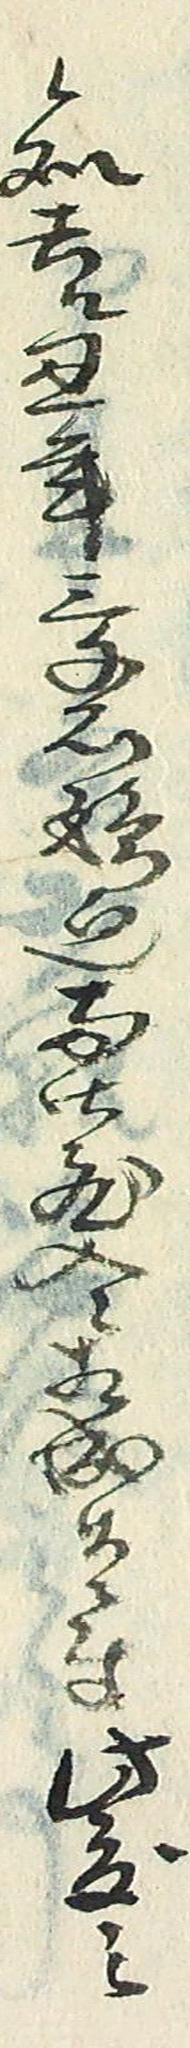候処去ル丑年三千石積廻両御蔵入ニ相成候ニ付此度之
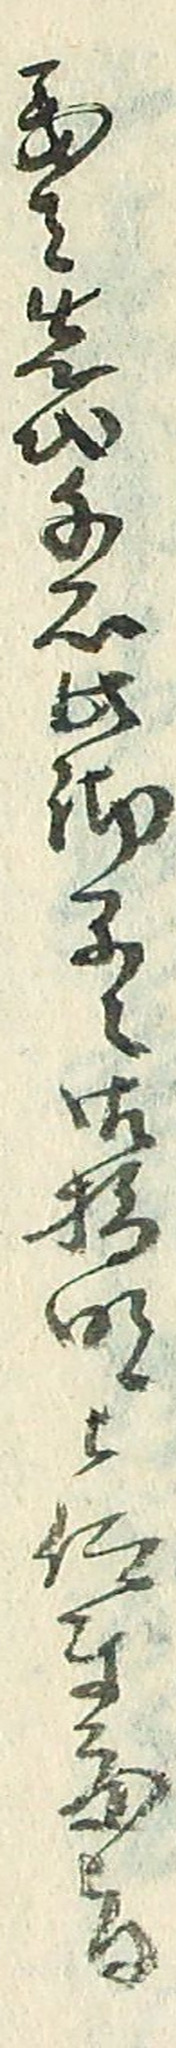義者先弐千石此砌早々御指明被仰付度旨
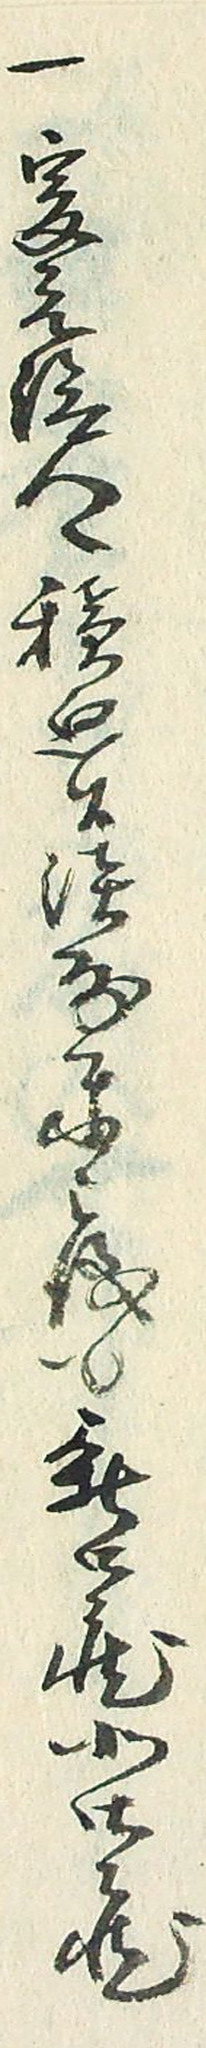一爰元給人へ積廻候淡州米之儀も新御蔵北御蔵
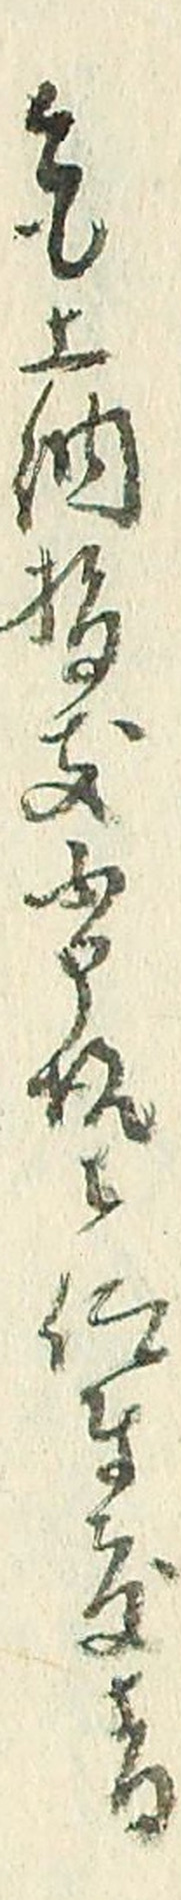にも上納指支不申様被仰度旨

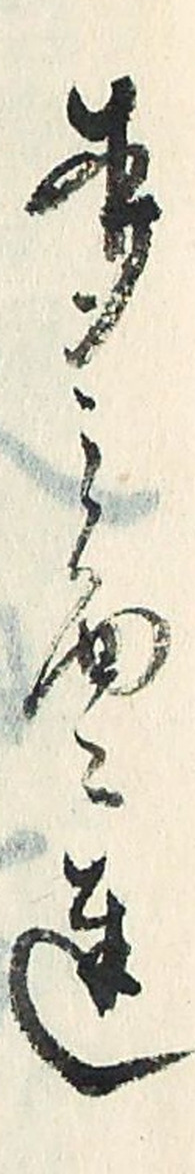本〆之面々達
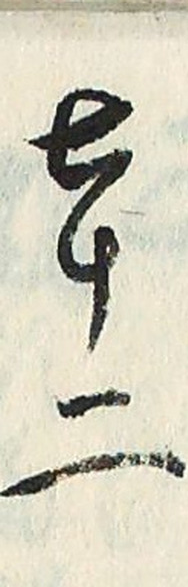七十二
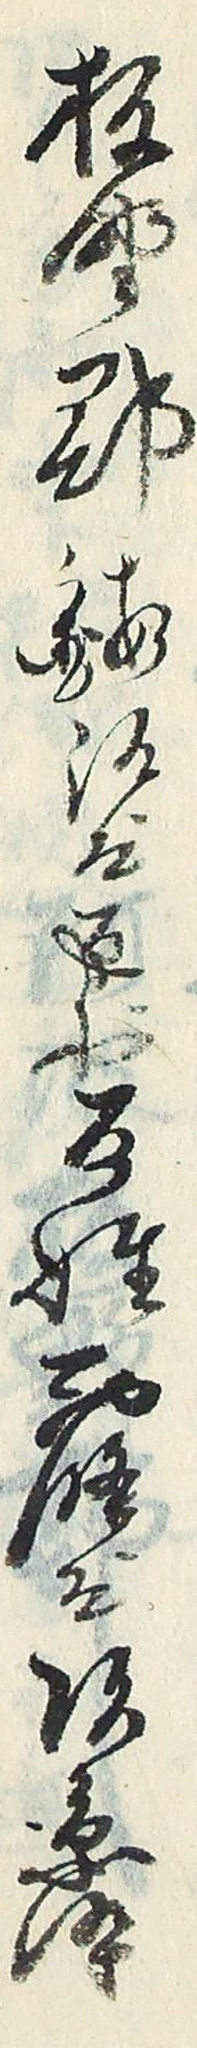板野郡鍛冶屋原村百姓西條屋次兵衛伜
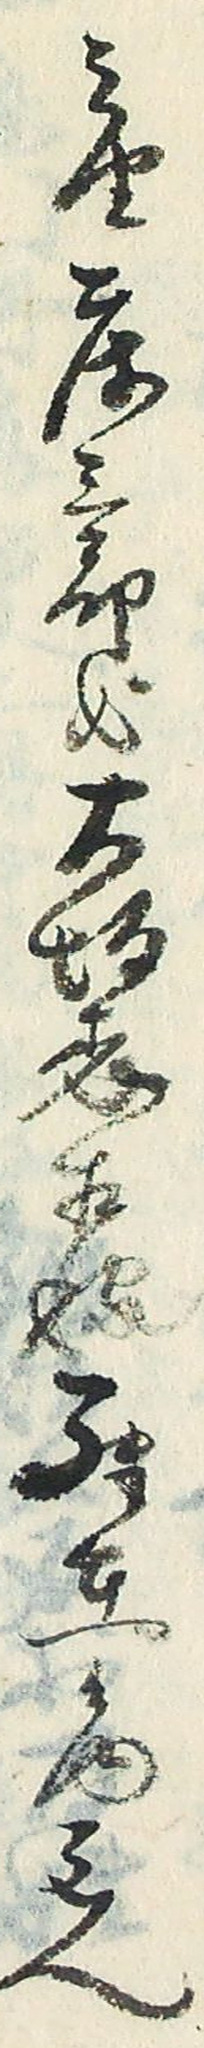之由茂三郎義大坂表相稼罷在候内主人
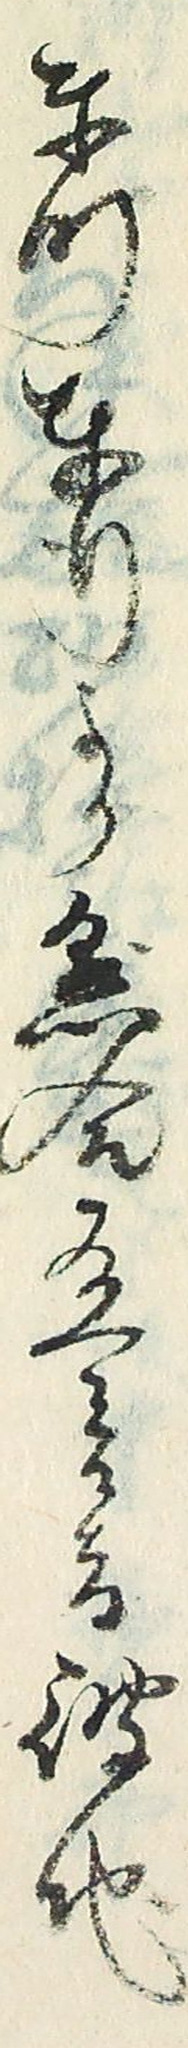東町奉行より懸合有之候旨彼地
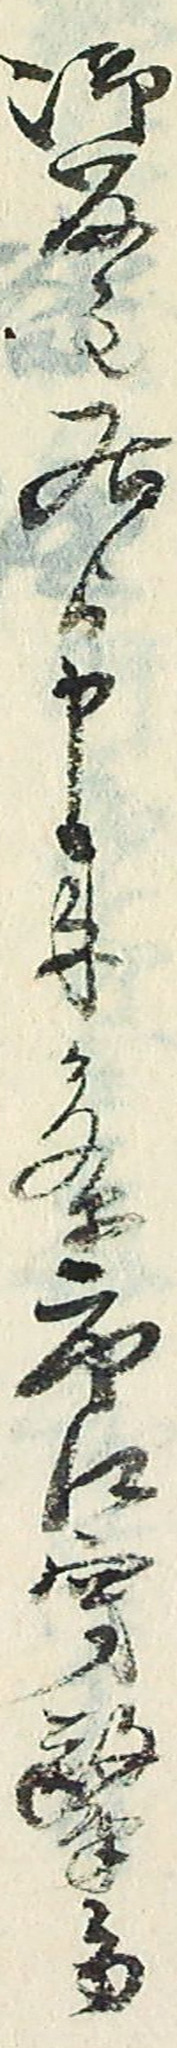御留主居ゟ申来候条市郷穿鑿方
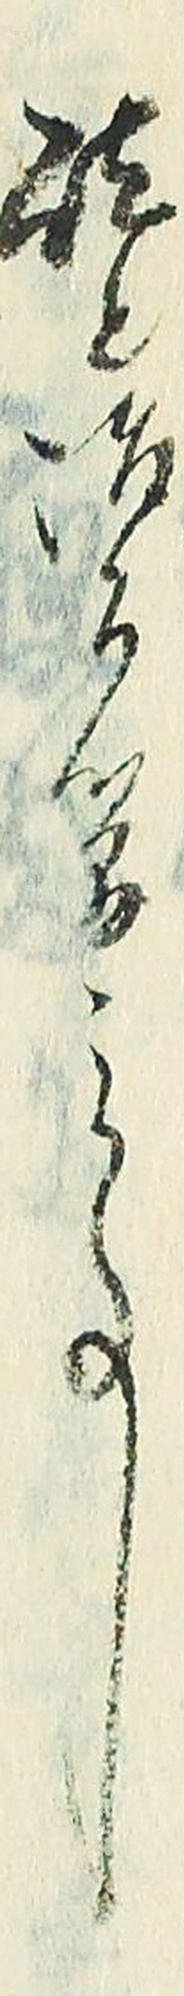屹と御了簡之事
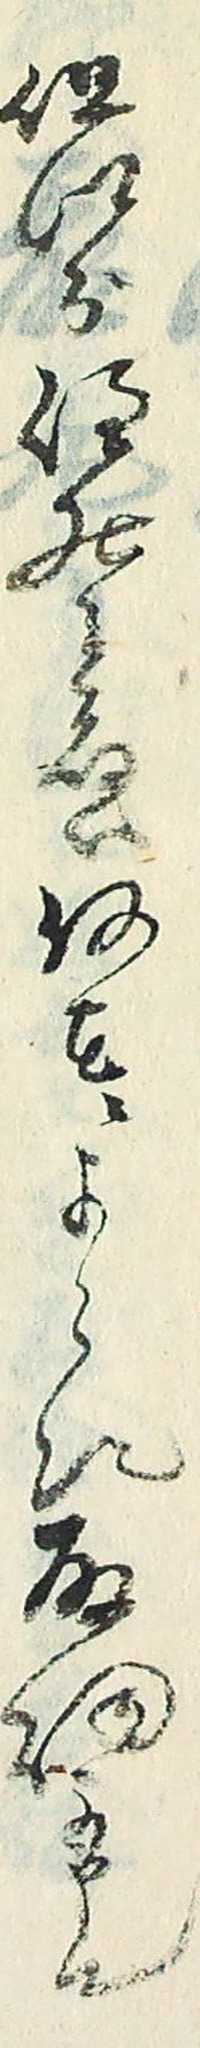但郷分住居之者ハ何者ニよらす取調可申候
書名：諸御趣意書并御下知向之写
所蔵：鳴門教育大学 Naruto University of Education
